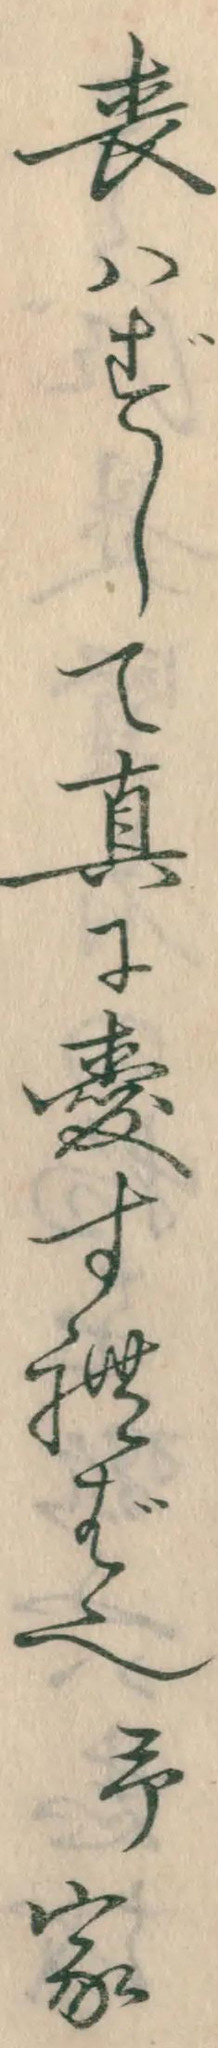喪はずして真に愛すれば也予家
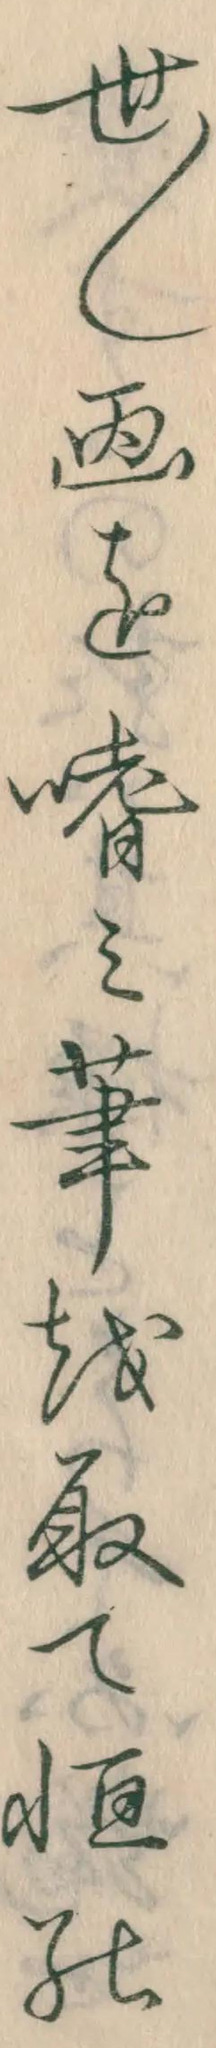世〱画を嗜み筆を取て恒の
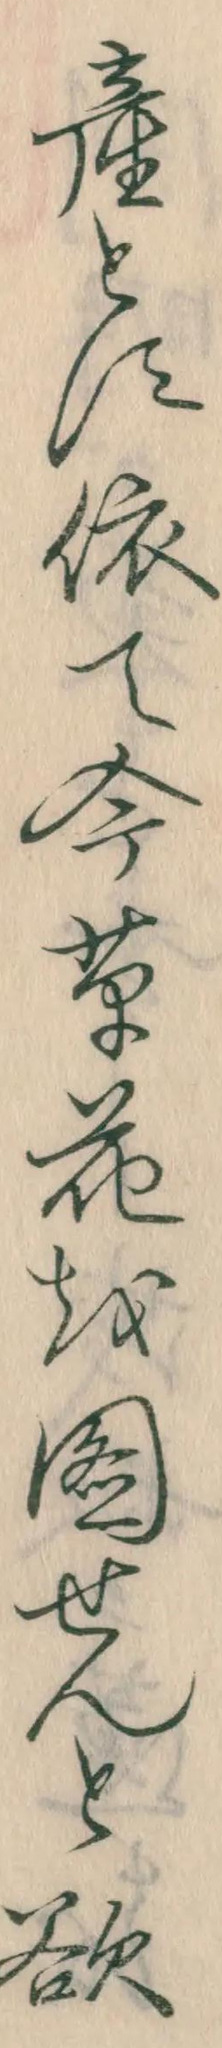産とす依て今草花を図せんと欲
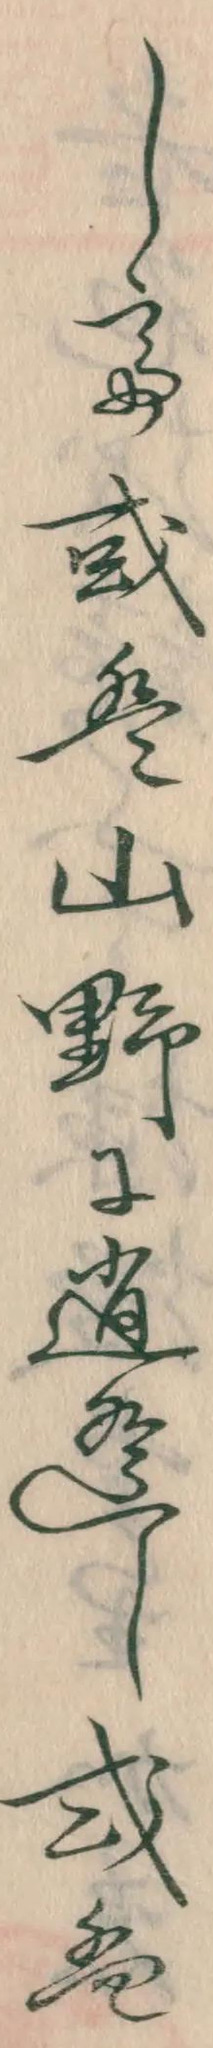して或は山野に逍遥し或は
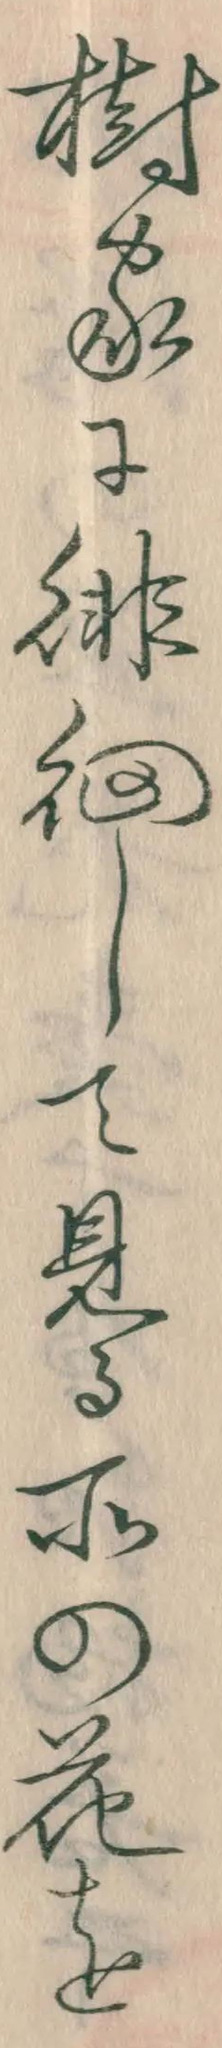樹家に徘徊して見る所の花を
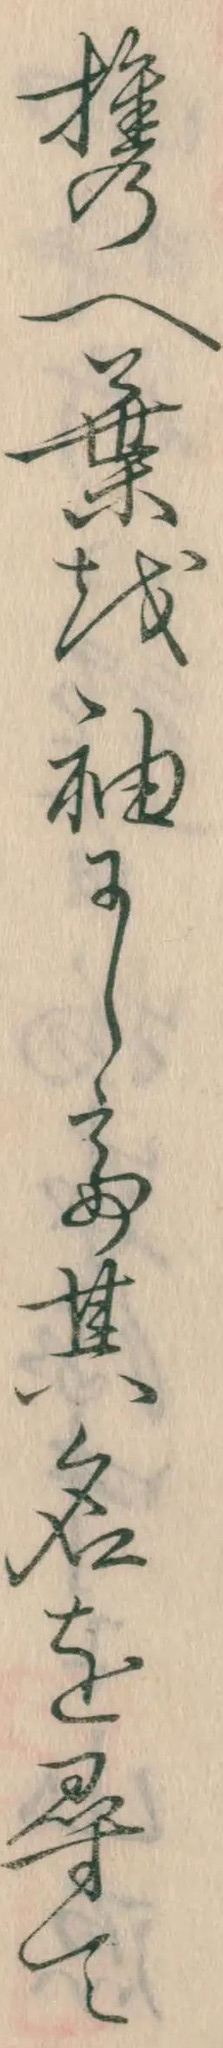携へ葉を袖にして其名を尋て
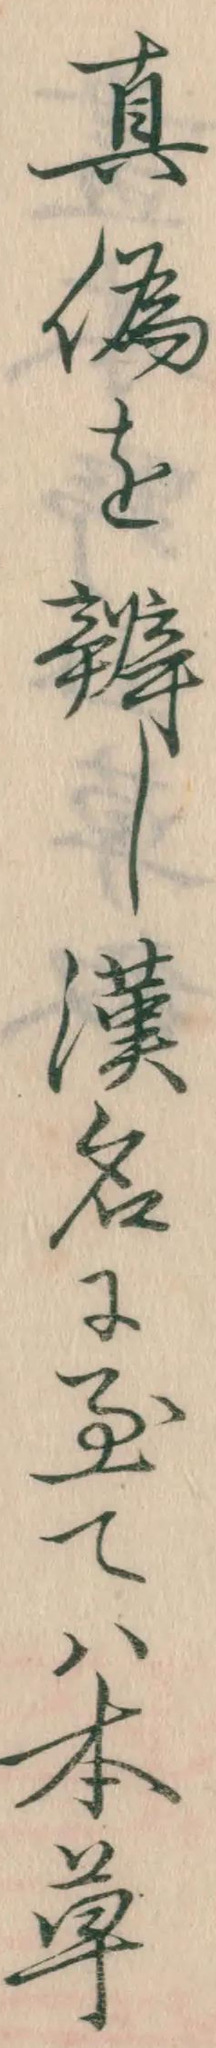真偽を弁し漢名に至ては本草
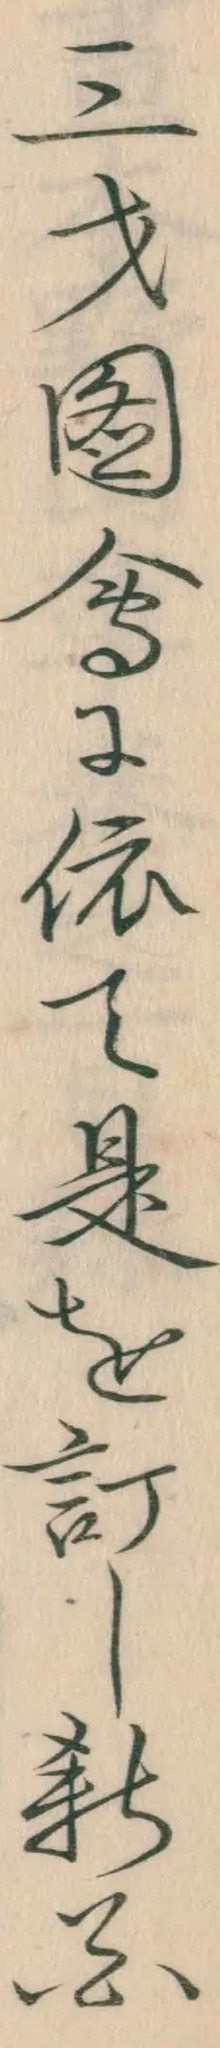三才図会に依て是を訂し新花
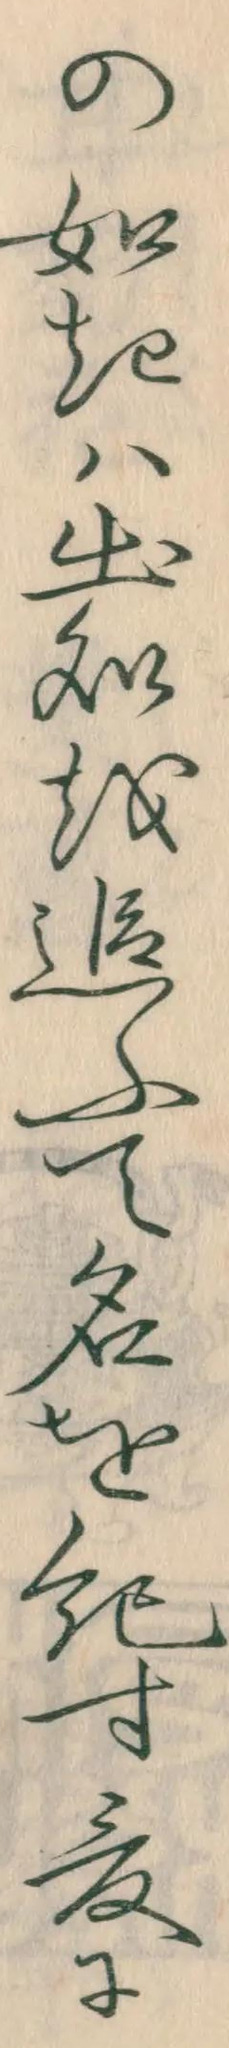の如きは出処を追ふて名を紀す爰に
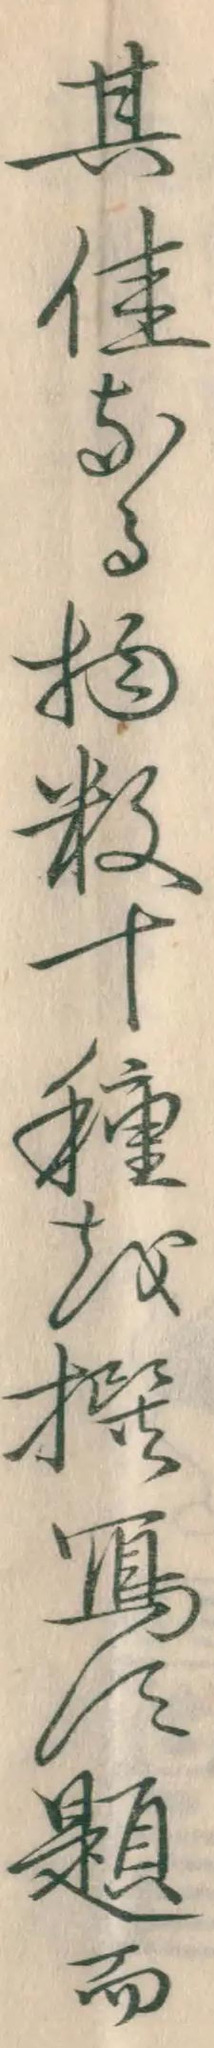其佳なる物数十種を撰写す題而
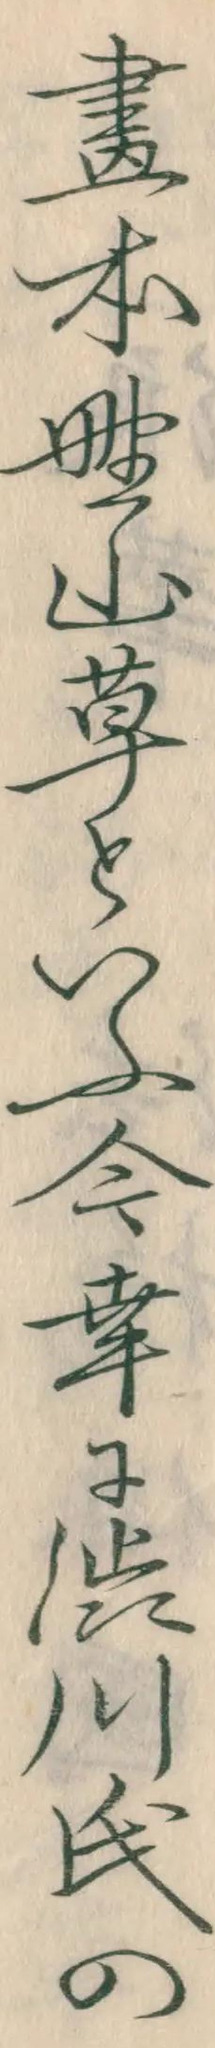画本野山草といふ今幸に渋川氏の
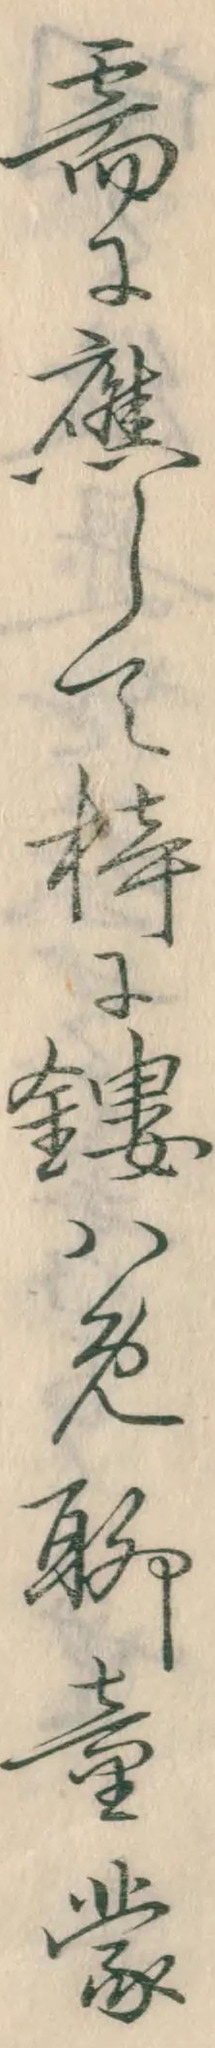需に応して梓に鏤はめ聊童蒙
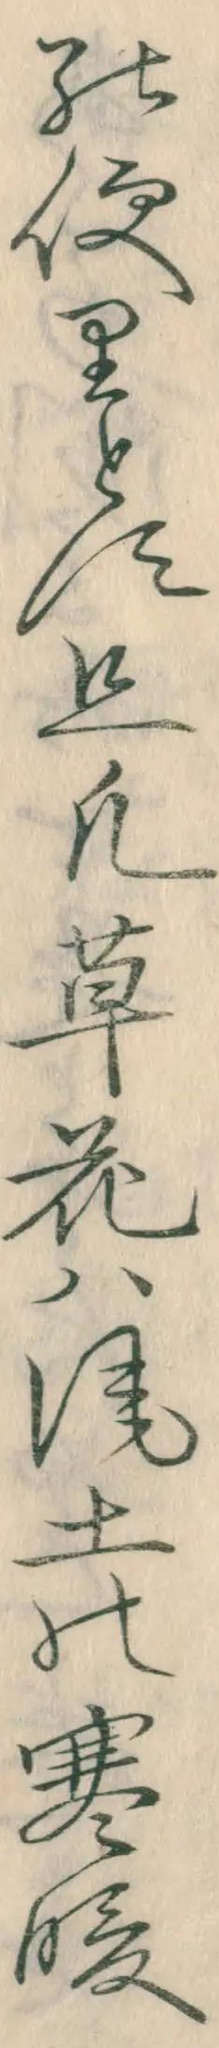の便りとす且凡草花は風土の寒暖
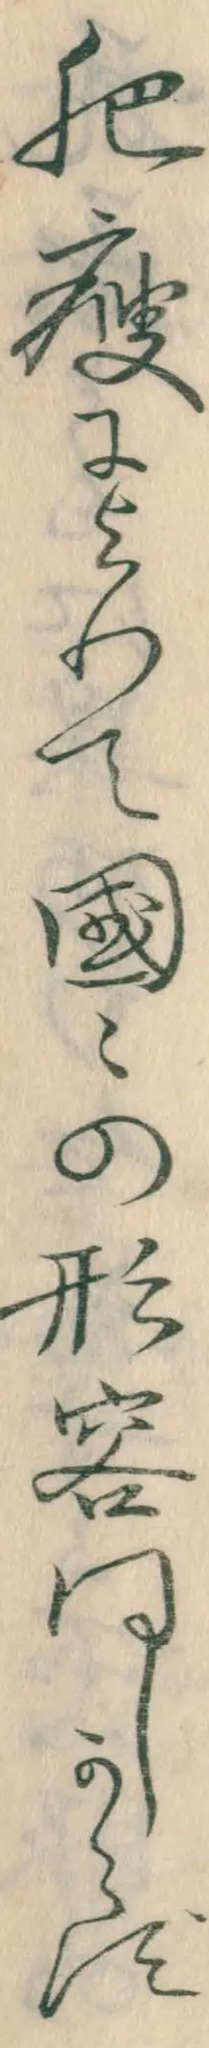肥痩によりて国々の形容同しからず

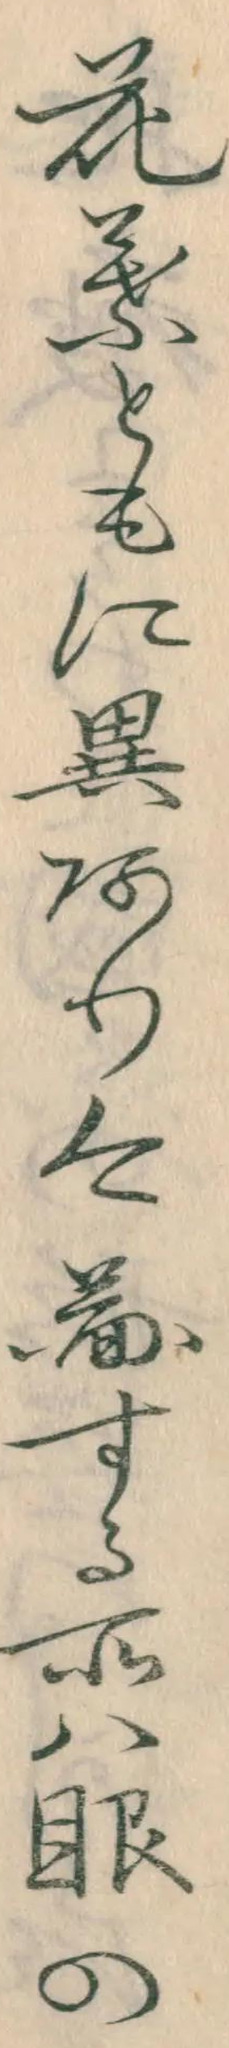花葉ともに異あり今図する所は眼の
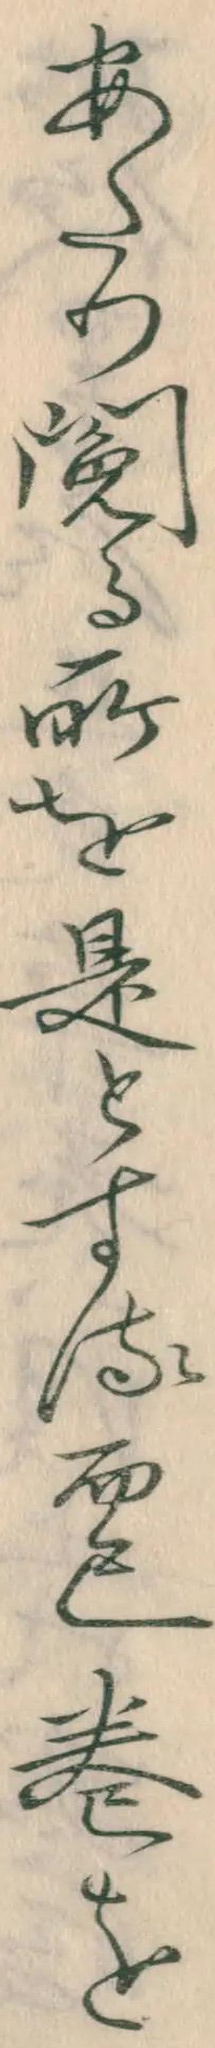あたり𨵃る所を是とする而已巻を
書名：畫本野山草. [1]
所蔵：国立国会図書館 National Diet Library, JAPAN
